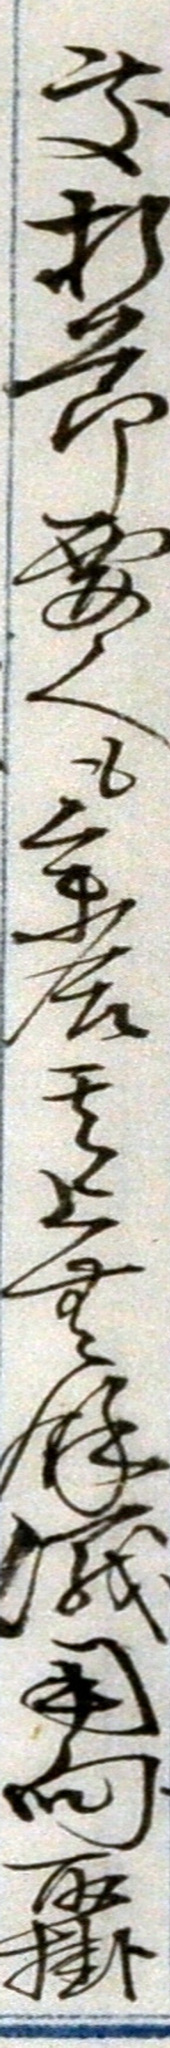處折節要人も参居其上無餘儀用向取掛
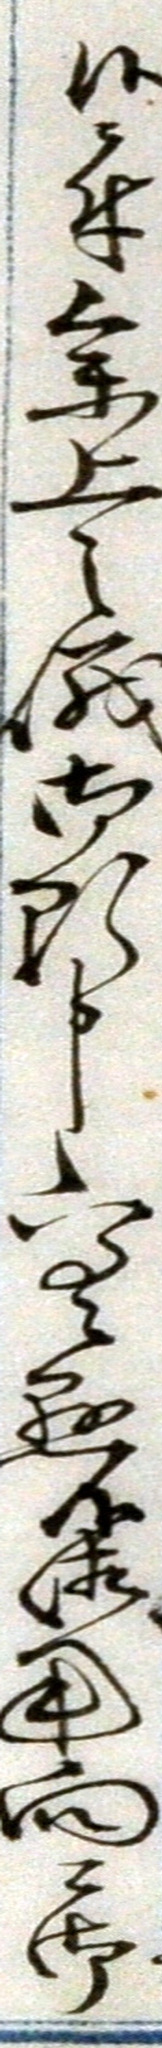候ニ付参上之儀御断申候差懸候御用向二御
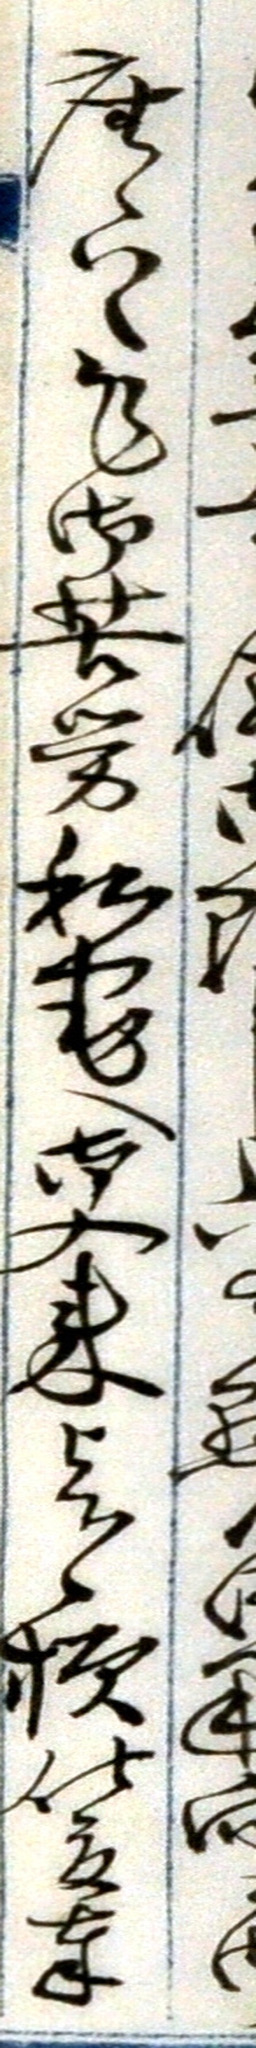座候ハヽ乍御苦労私宅へ御入来被下候様仕度奉

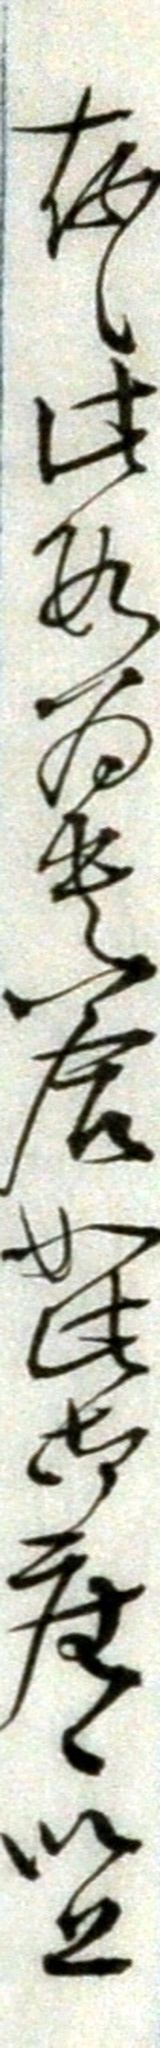存候此段為貴答如此御座候以上
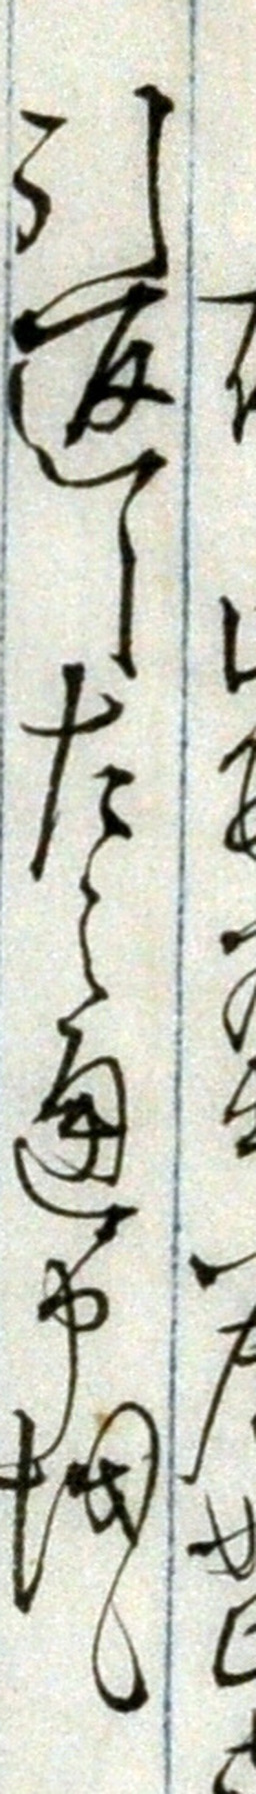引返し左之通申越候
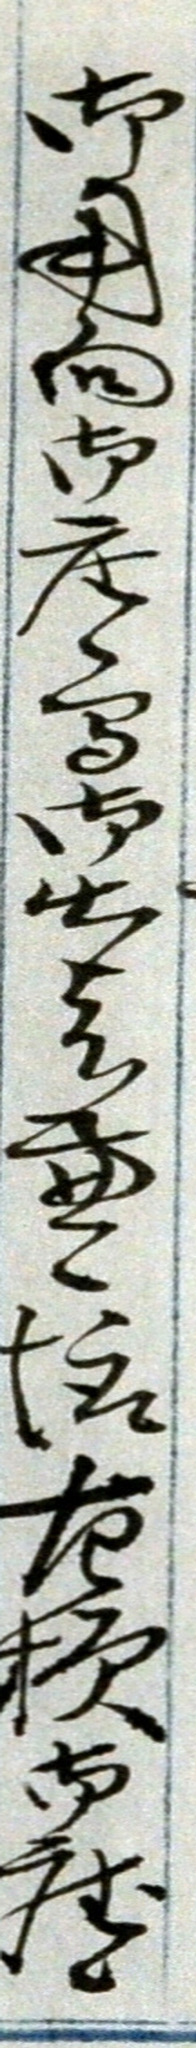御用向御座候間御出被下兼候趣左様御座候
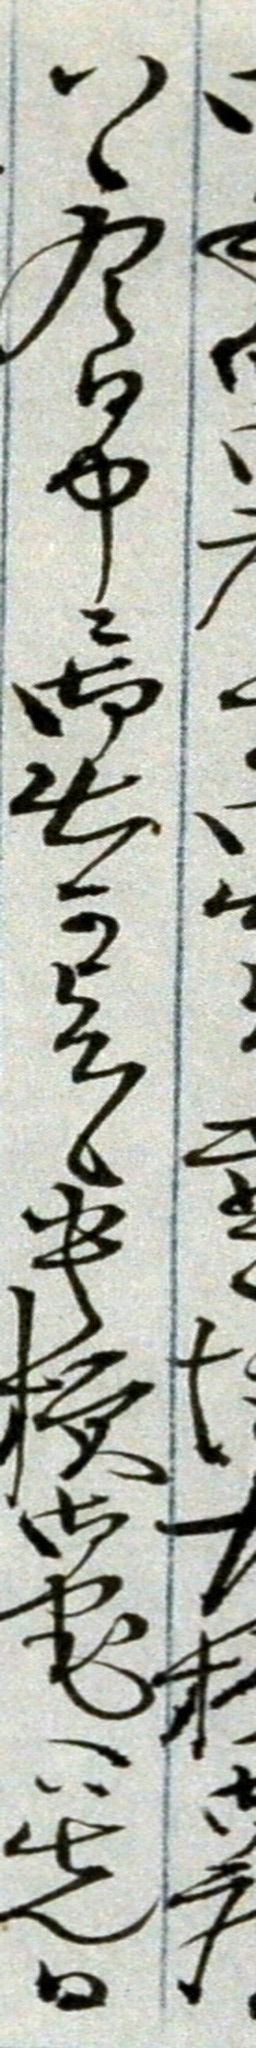ハヽ今日中ニ御出可被下候貴様御宅へハ先日
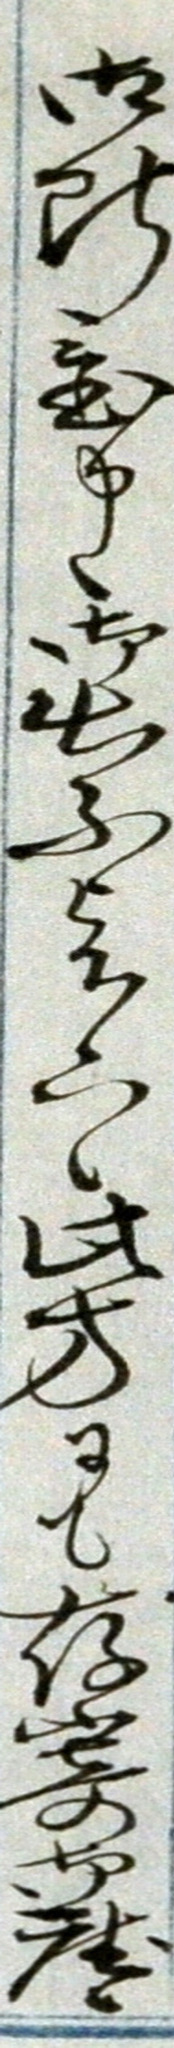御断置申候御出不被下候ハヽ此方尓も存寄御座候
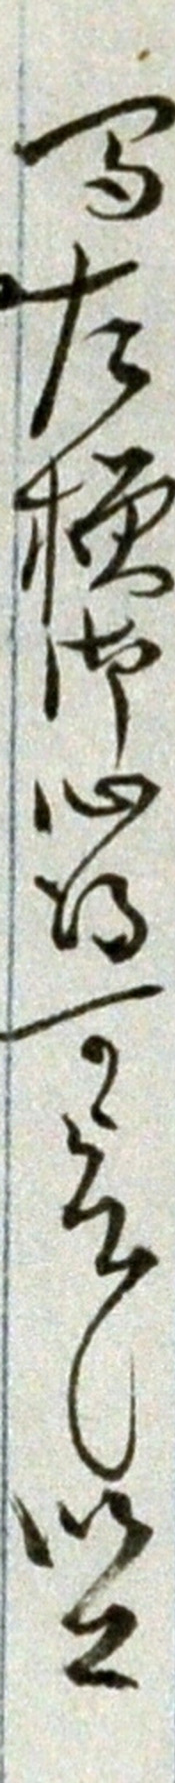間左様御心得可被下候以上
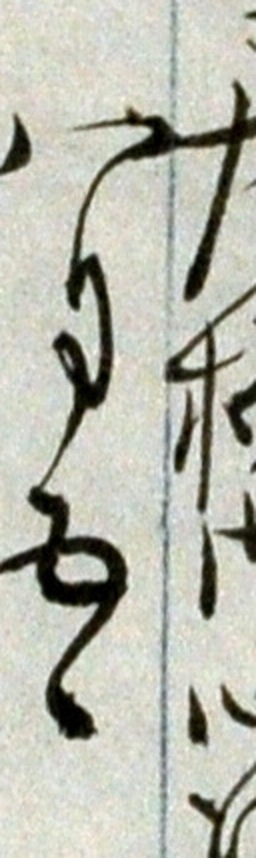八月五日
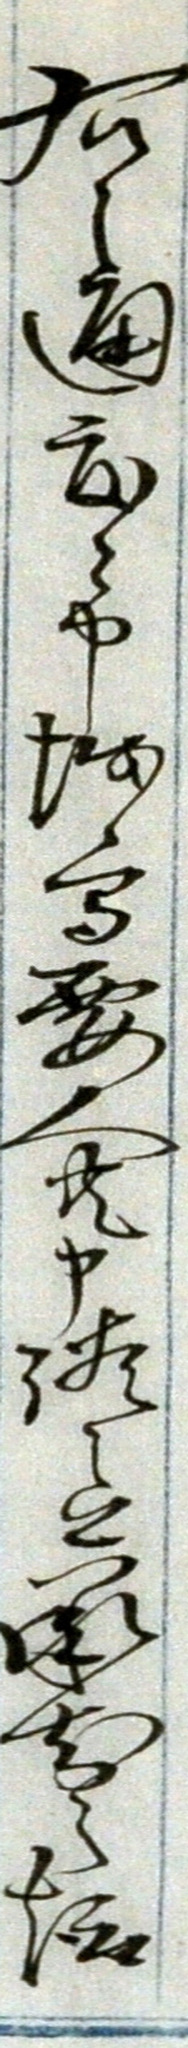右之通度々申越候間要人共申談之上承知之趣
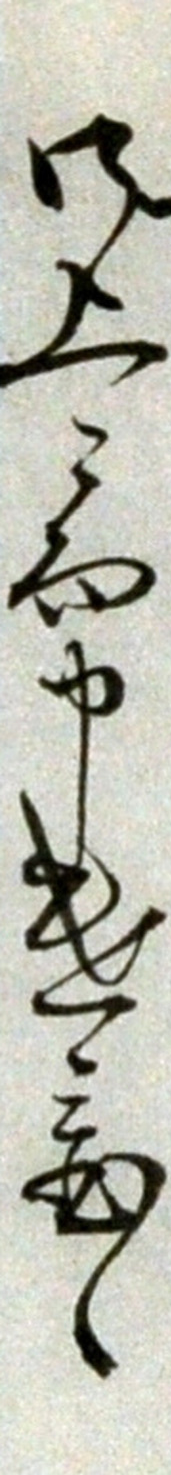口上ニ而申遣置候
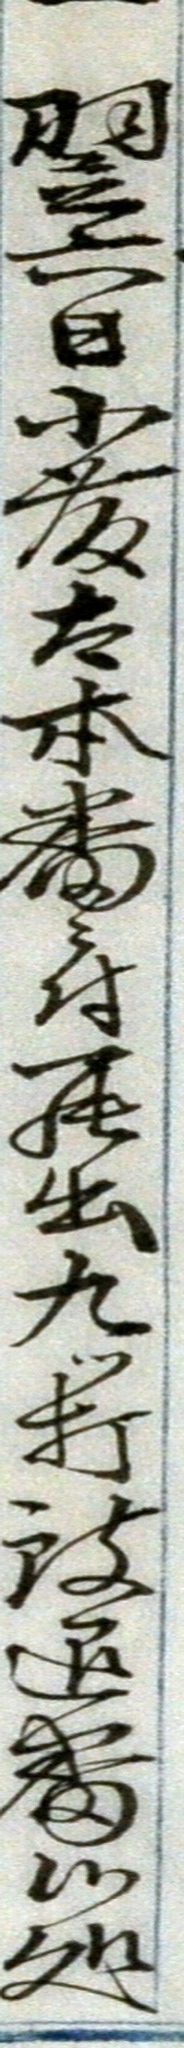一翌六日小藤太本番ニ付罷出九ツ打致退番候処
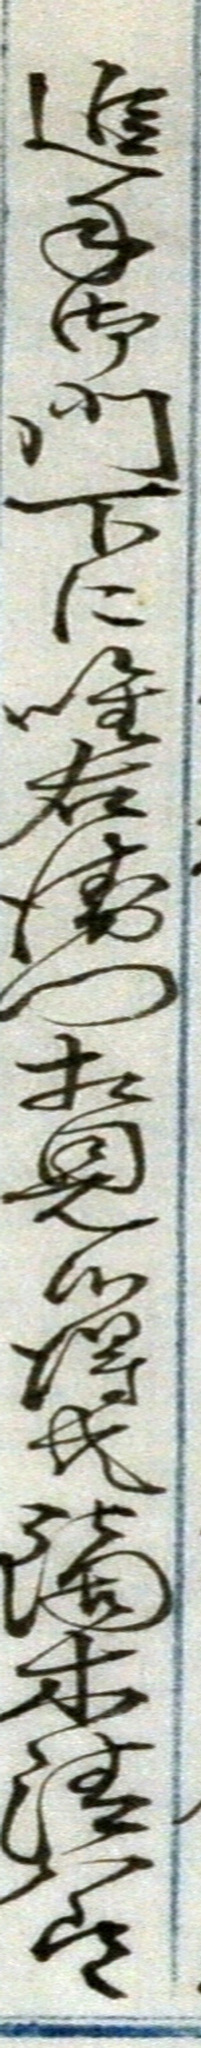追手御門下に唯右衛門相見候得共鏑木清八郎
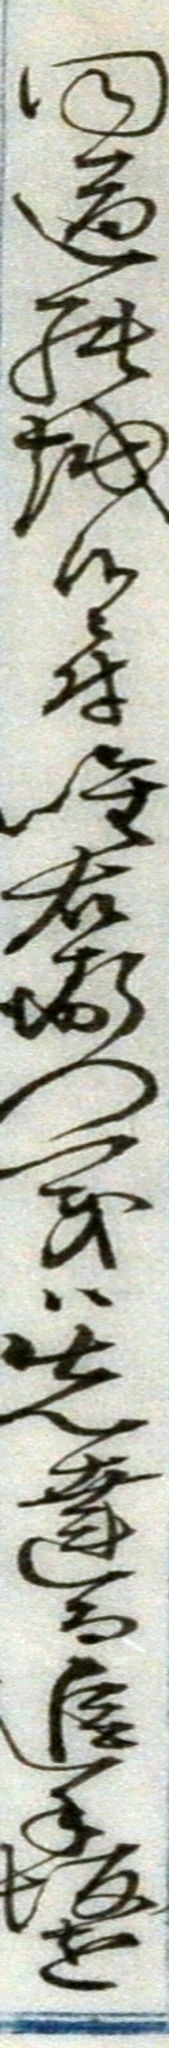同道罷越候ニ付唯右衛門義ハ先達而追手坂を
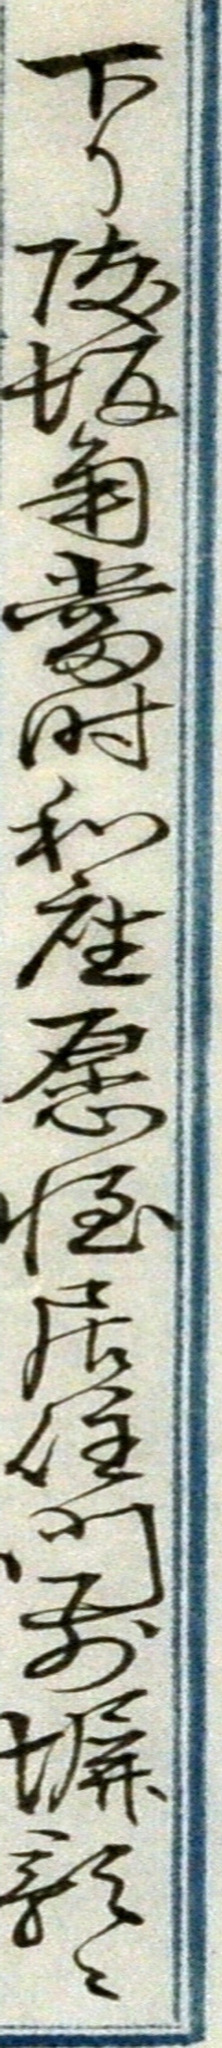下り殿坂角当時和座愿恒居住門前塀影二
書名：川面小藤太子細有之多賀谷唯右衛門ヲ打果候一件
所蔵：伊那市立高遠町図書館・合同会社AMANE
